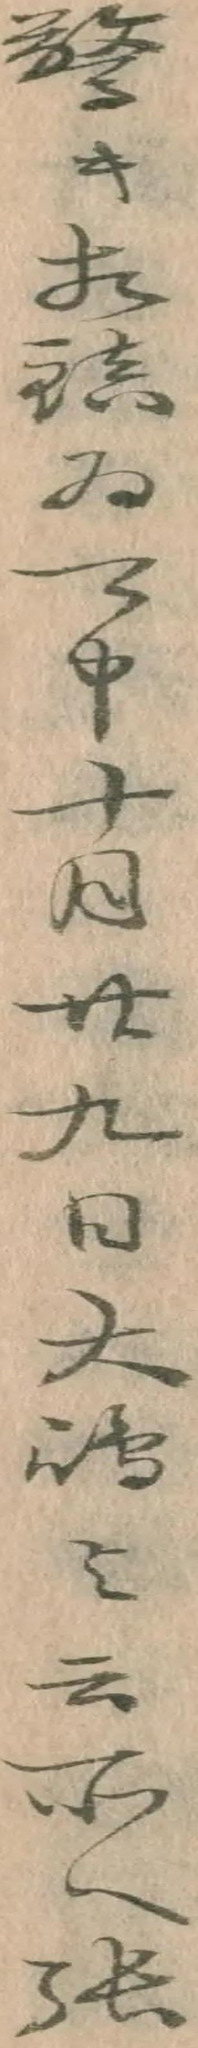驚き相鎮ゐ可申十月廿九日大島与云所へ張
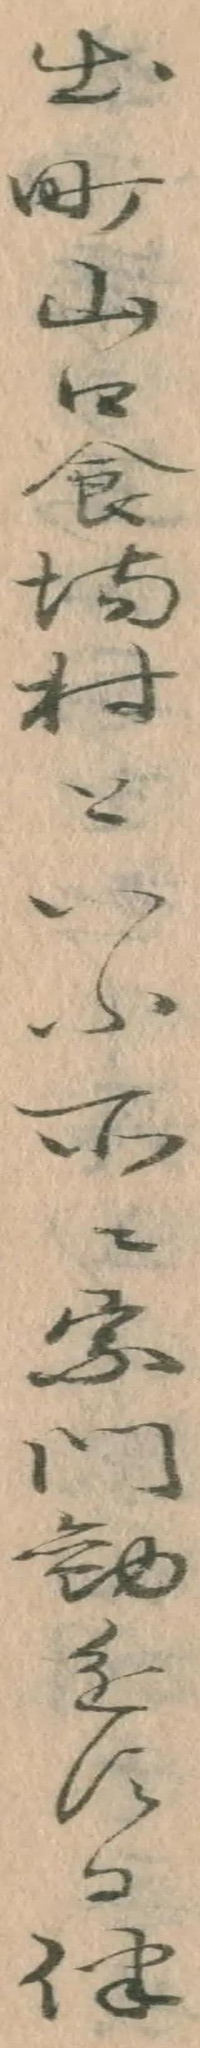出町山口食場村といふ所に宗門勧進須る伴
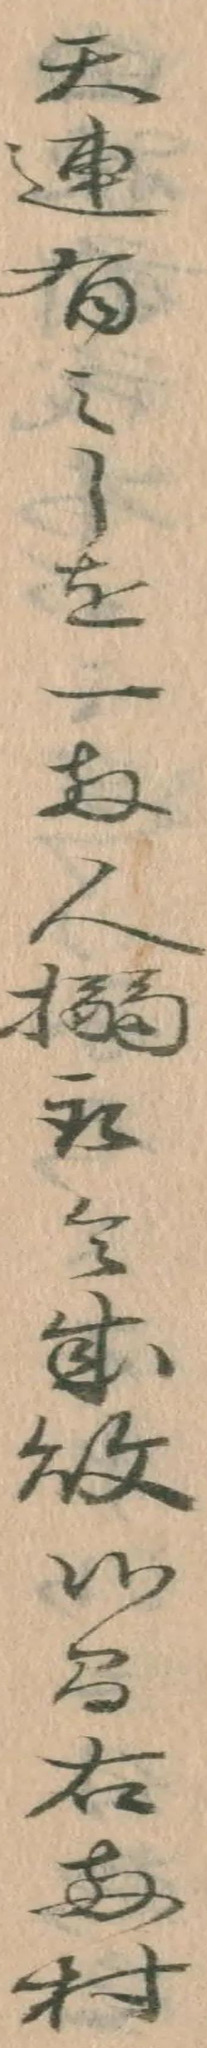天連有之しを一両人搦取令成敗候間右両村
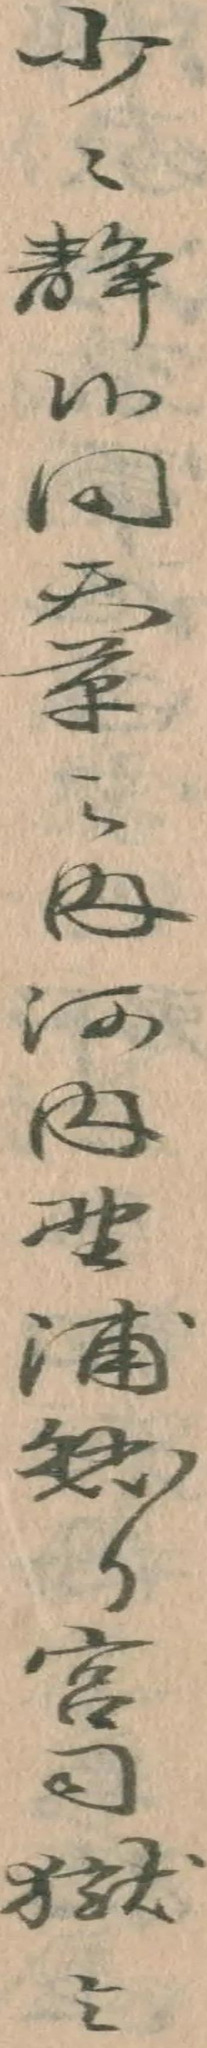少々静候同天草之内河内野浦懸り宮司獄与
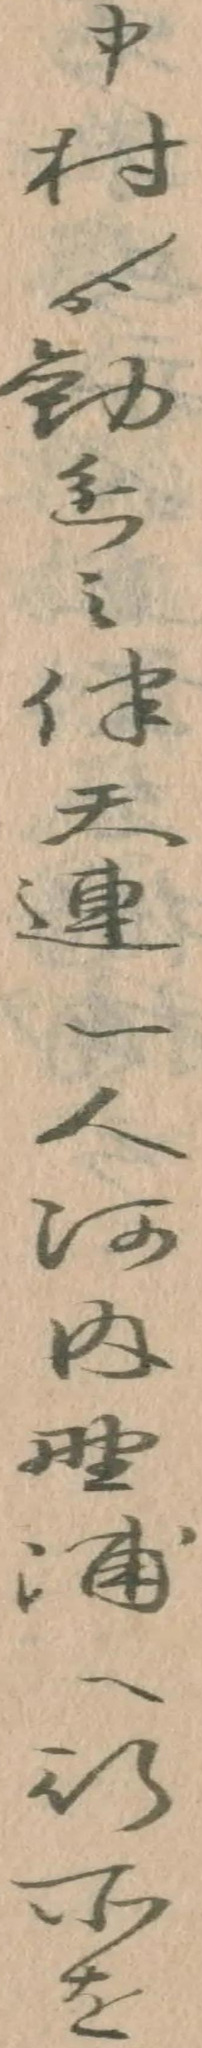申村ゟ勧進之伴天連一人河内野浦へ行所を
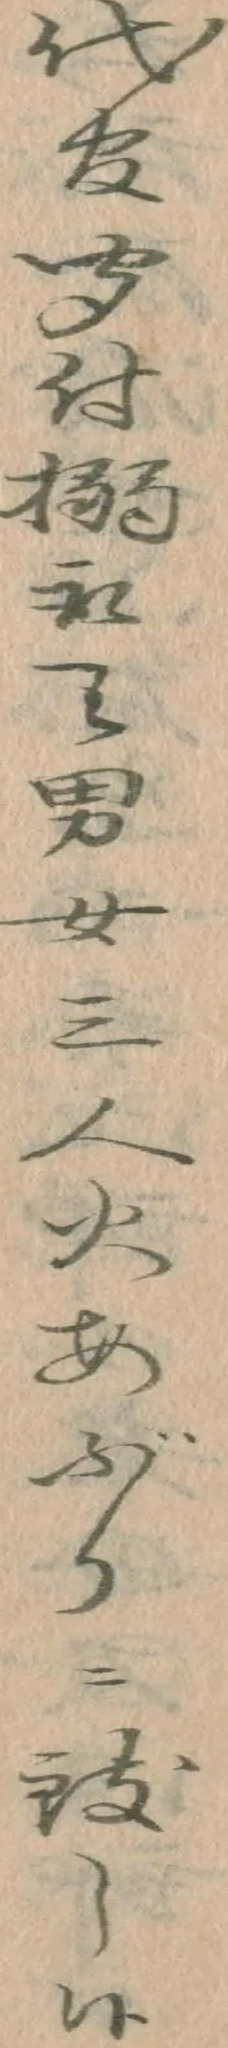代官聞付搦取て男女三人火あぶりに致し候
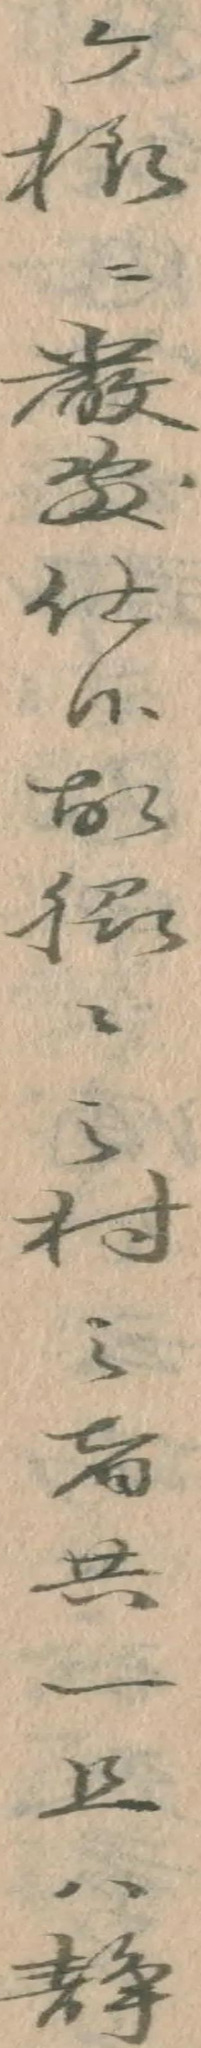け様に厳敷仕候故脇々之村之者共一旦は静
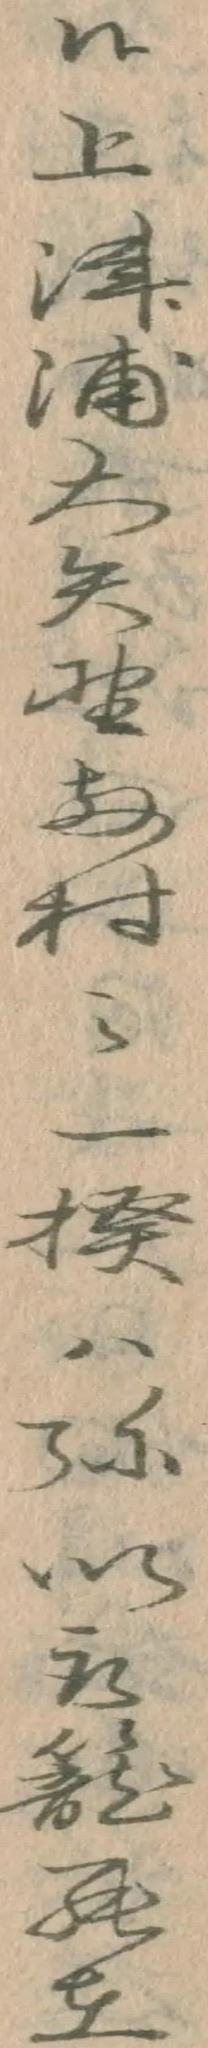候上津浦大矢野両村之一揆は弥以取籠罷在
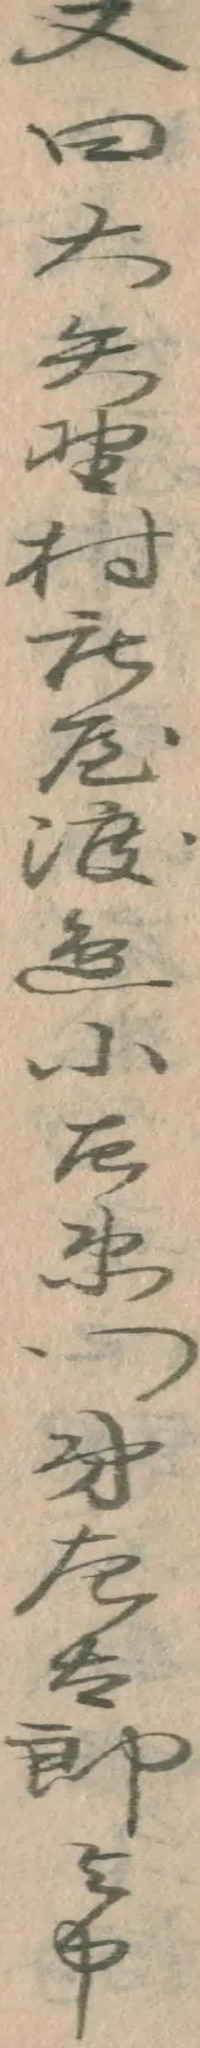又曰大矢野村庄屋渡辺小左衛門弟左太郎与申
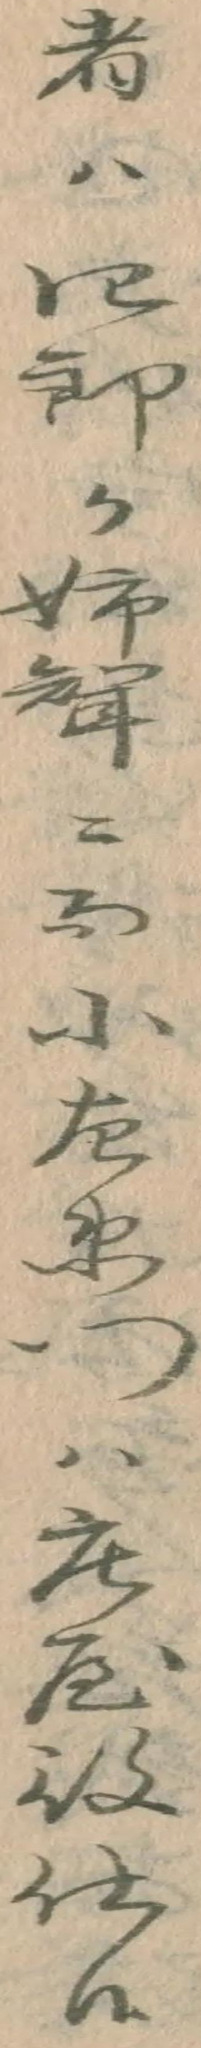者は四郎か姉聟に而小左衛門は庄屋役仕候
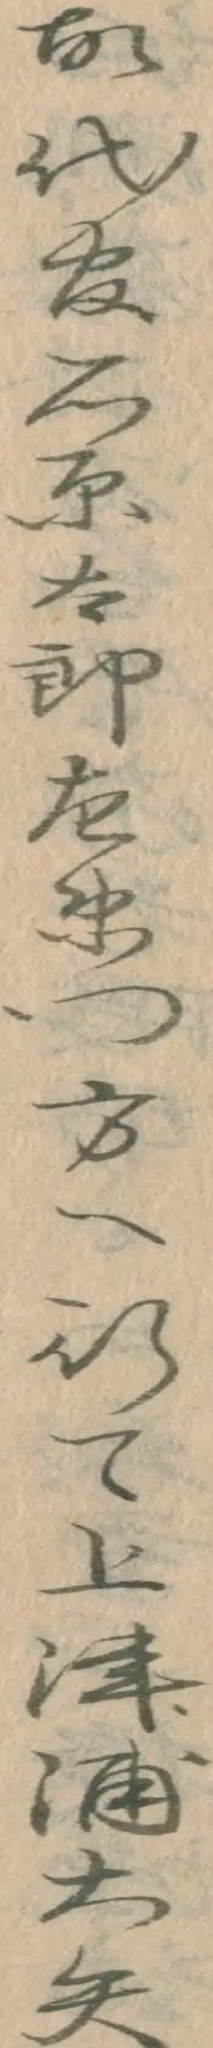故代官石原太郎左衛門方へ行て上津浦大矢
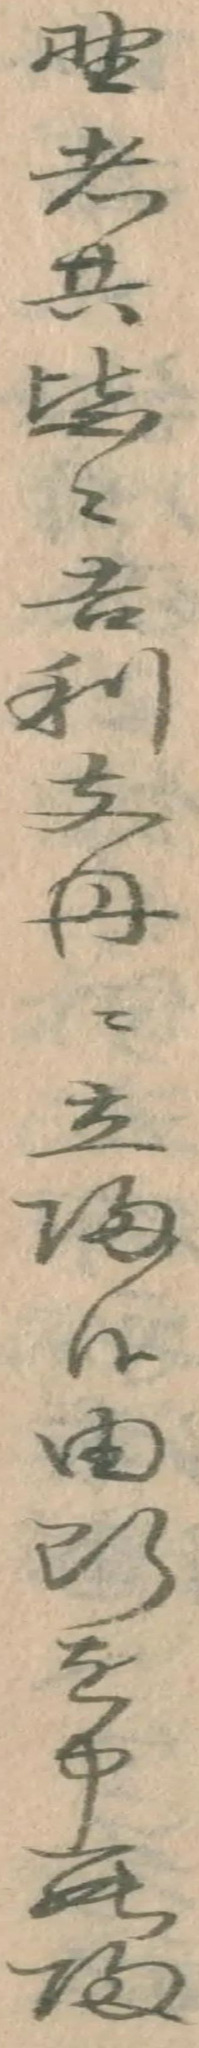野者共皆々吉利支丹に立帰候由断を申罷帰

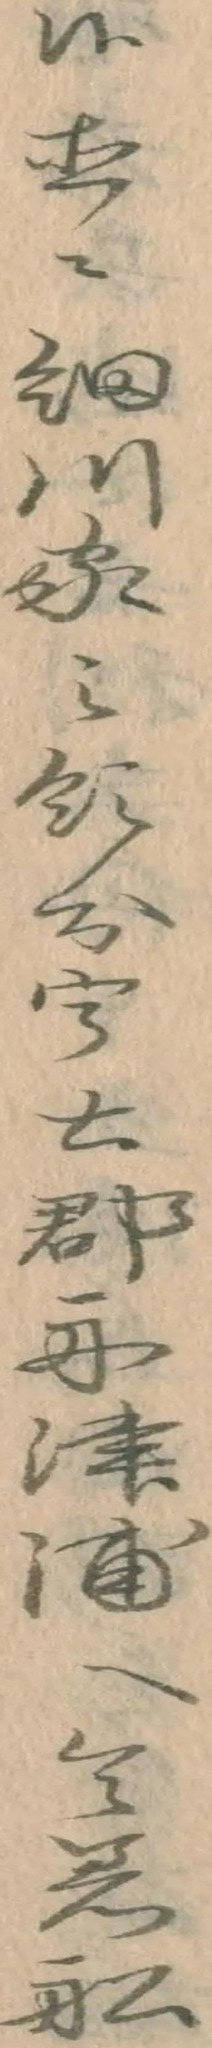候直に細川家之領分宇土郡舟津浦へ令着舩
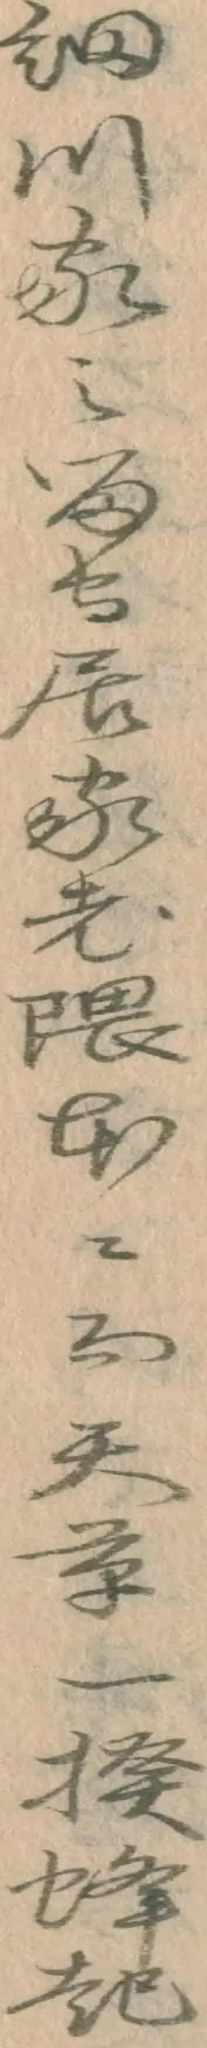細川家之留守居家老隈本に而天草一揆蜂起
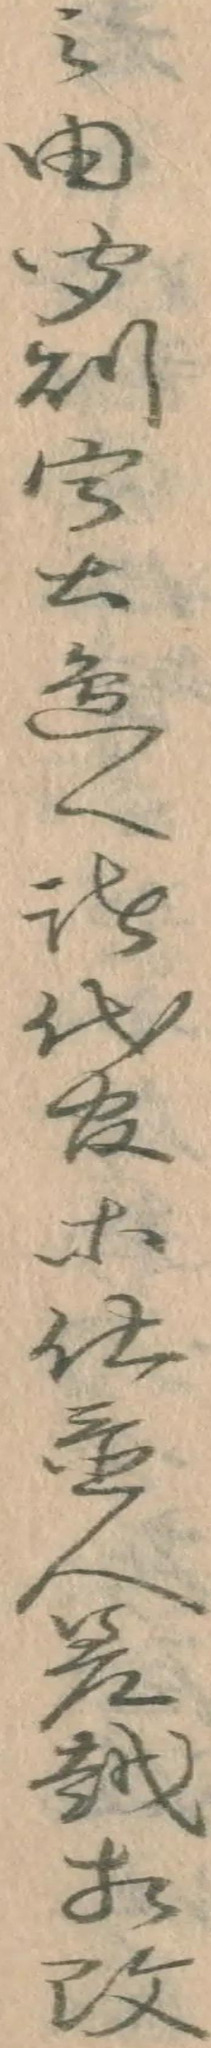之由聞則宇土辺へ諸代官等仕置人差越相改
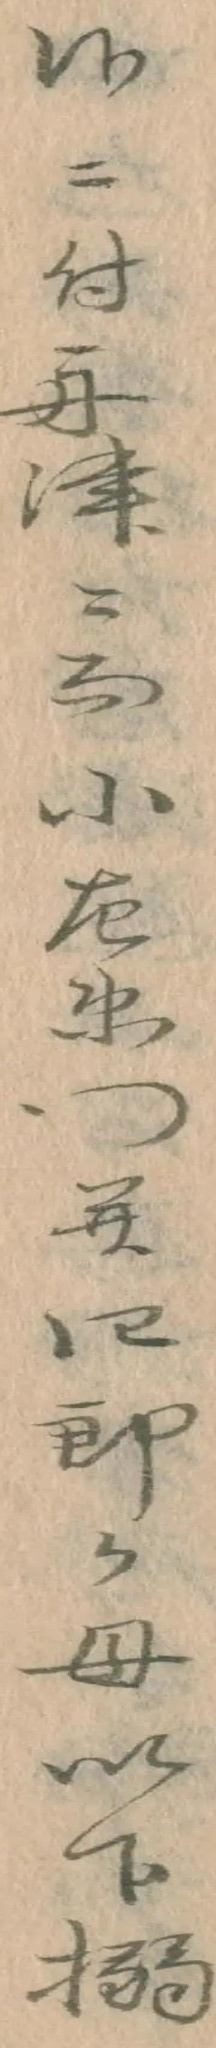候に付舟津に而小左衛門幷四郎か母以下搦
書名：切支丹御退治記 49巻. [2]
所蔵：国立国会図書館 National Diet Library, JAPAN
